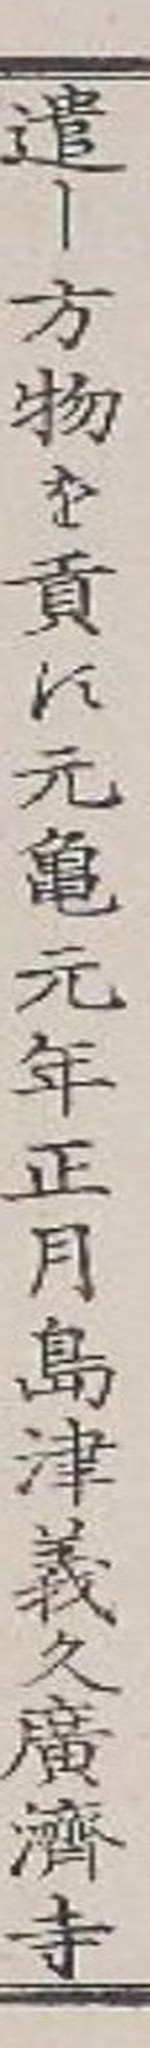遣し方物を貢す元亀元年正月島津義久広済寺
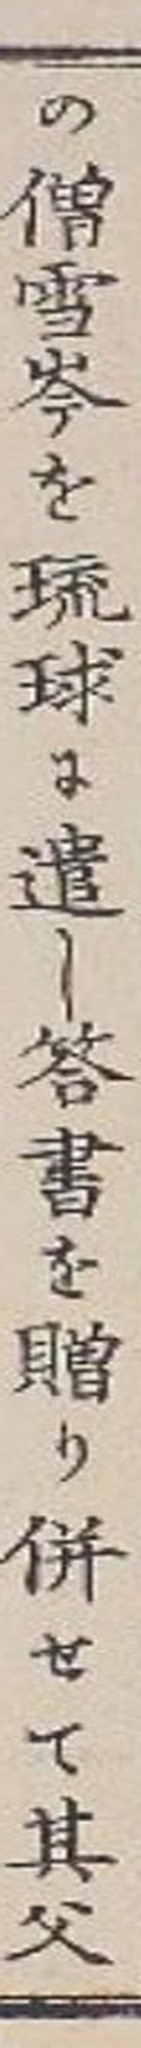の僧雪岑を琉球に遣し答書を贈り併せて其父
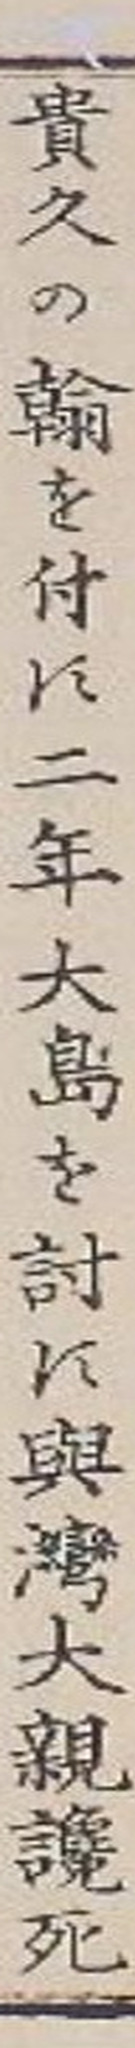貴久の翰を付す二年大島を討す与湾大親讒死
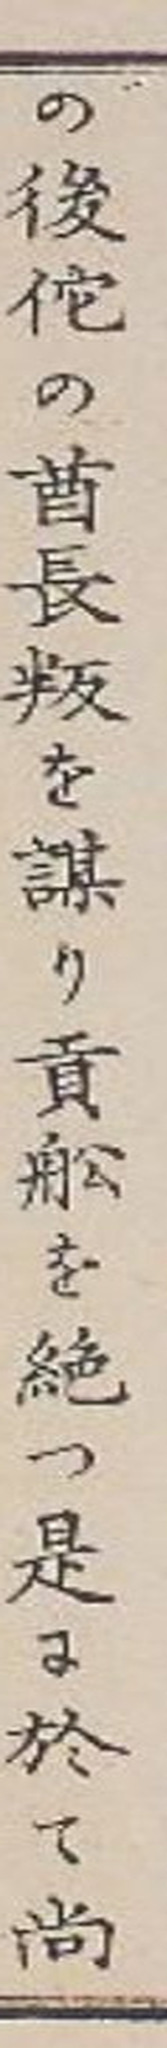の後侘の酋長叛を謀り貢舩を絶つ是に於て尚
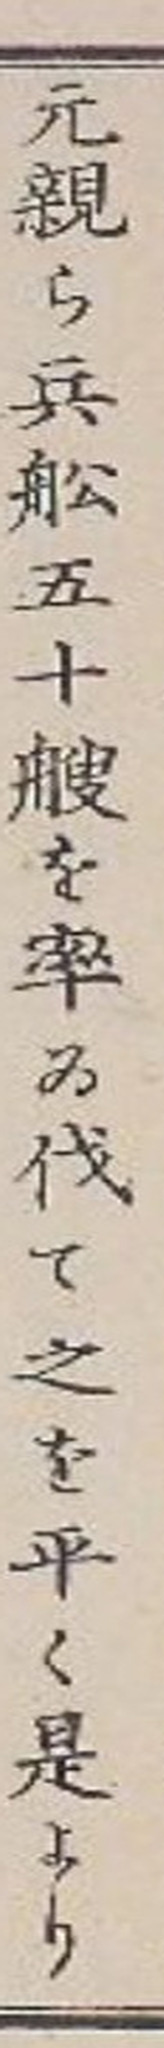元親ら兵舩五十艘を率ゐ伐て之を平く之より
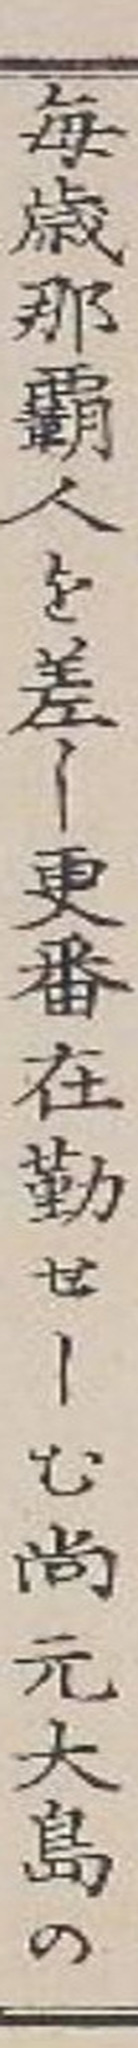毎歳那覇人を差し更番在勤せしむ尚元大島の
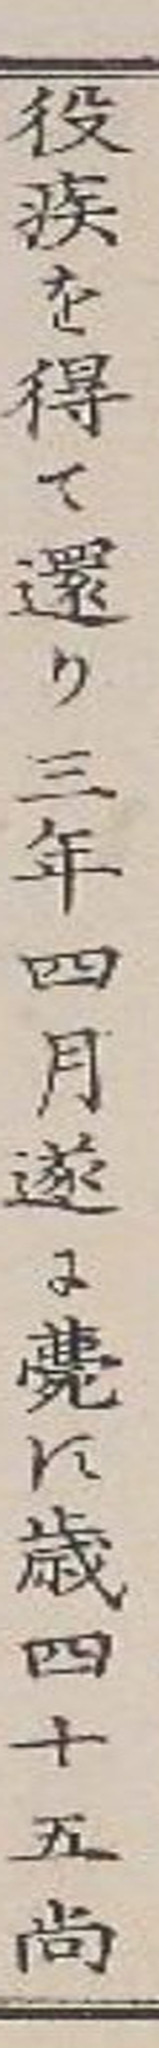役疾を得て還り三年四月遂に薨す歳四十五尚
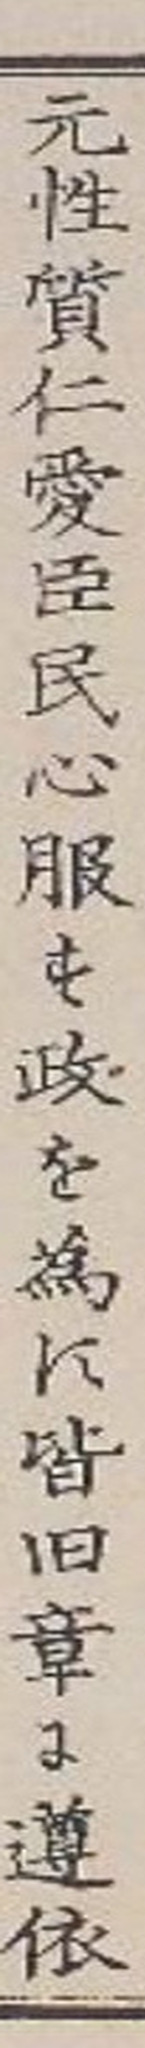元性質仁愛臣民心服す政を為す皆旧章に遵依
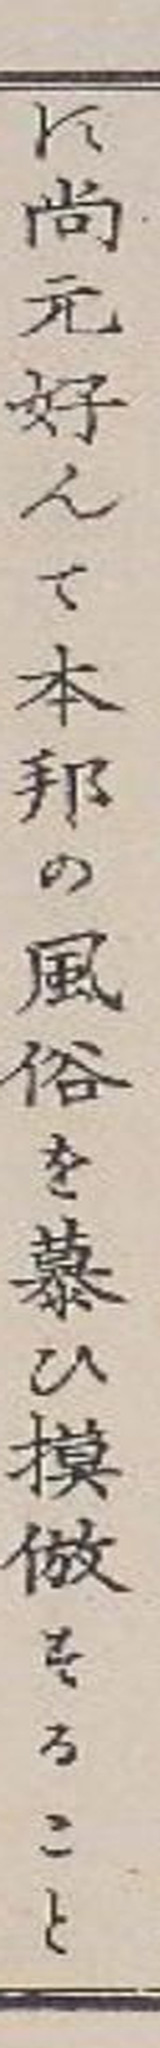す尚元好んで本邦の風俗を慕い模倣すること
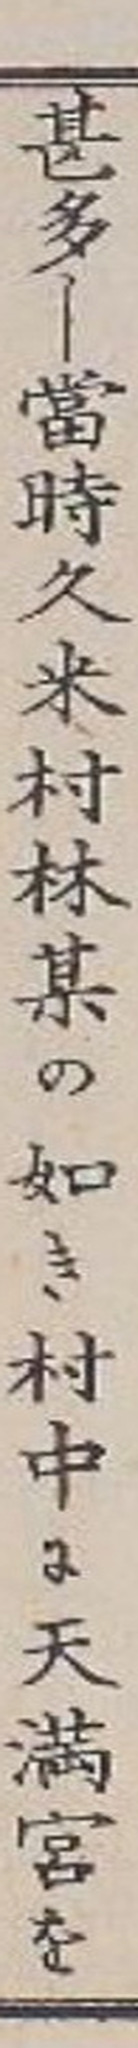甚多し当時久米島村林某の如き村中に天満宮
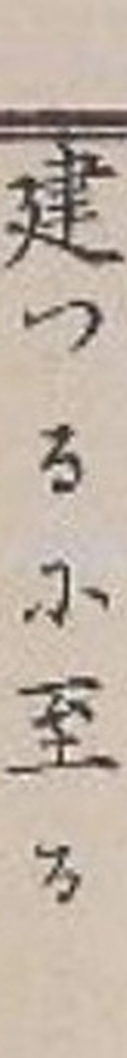建つるに至る

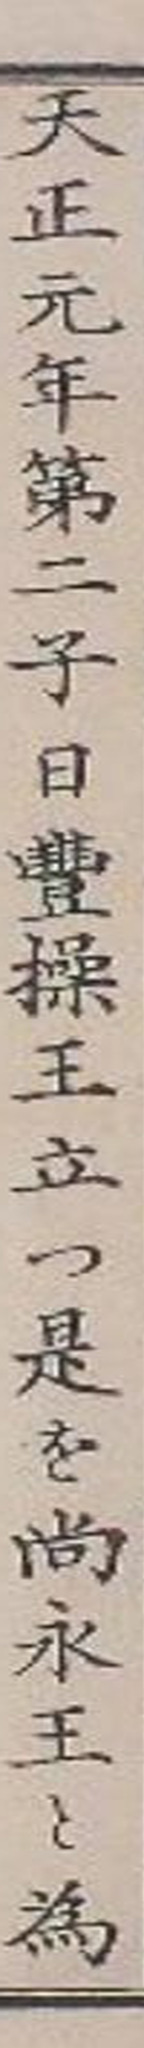天正元年第二子日豊操王立つ是を尚永王と為
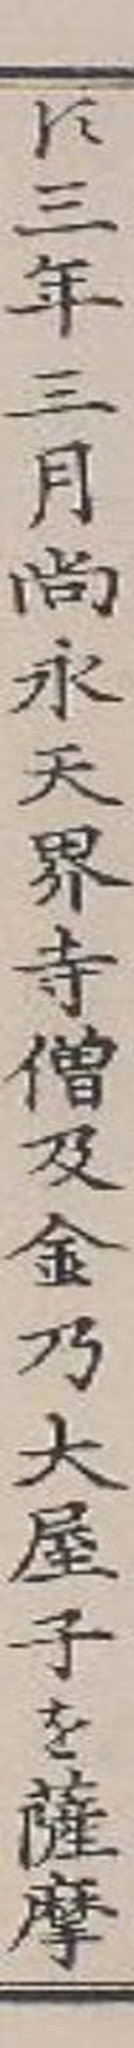す三年三月尚永天界寺僧及金乃大屋子を薩摩
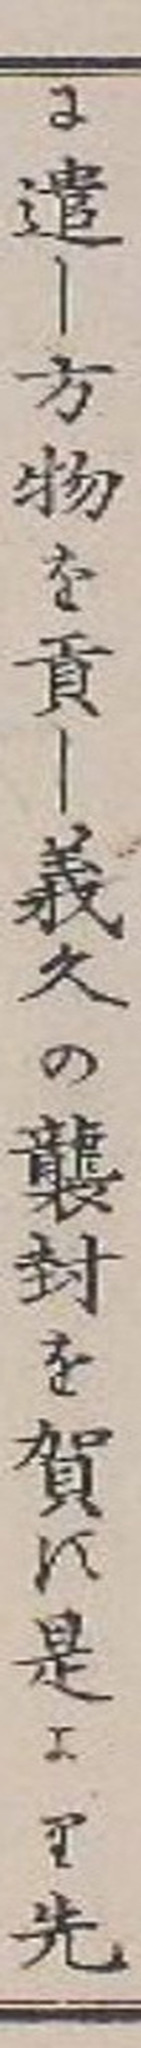に遣し方物を貢し義久の襲封を賀す是より先
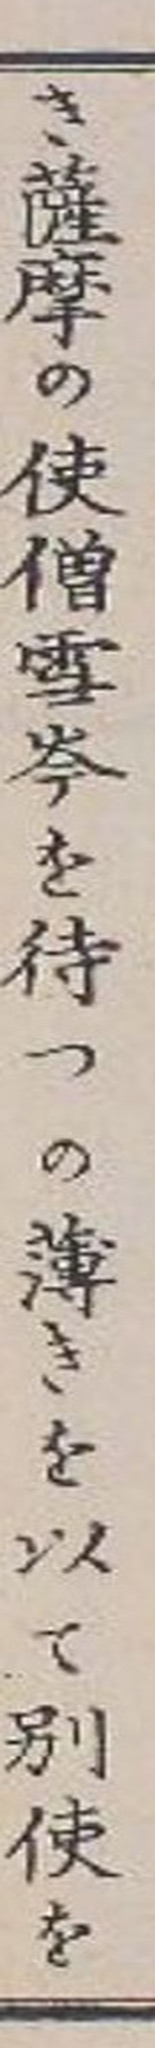き薩摩の使僧雪岑を待つの薄きを以て別使を
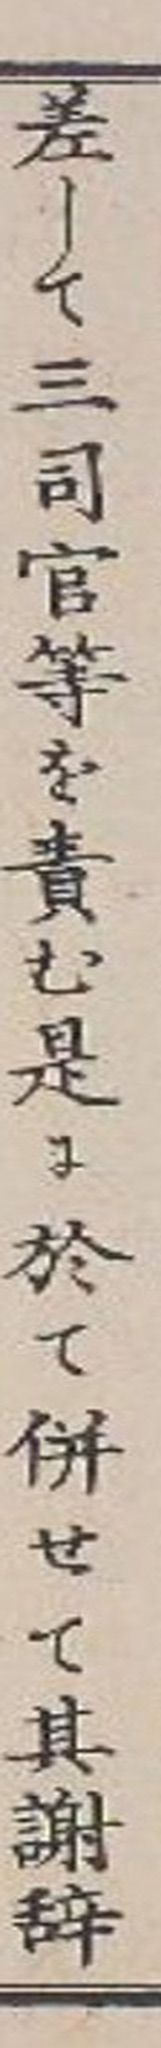差して三司官等を責む是に於て併せて其謝辞
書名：南島紀事 中
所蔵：University of the Ryukyus Library
